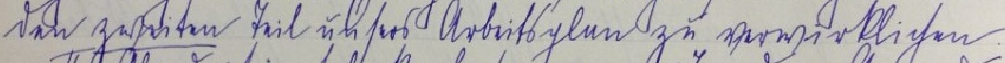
den zweiten Teil unseres Arbeitsplans zu verwirklichen.
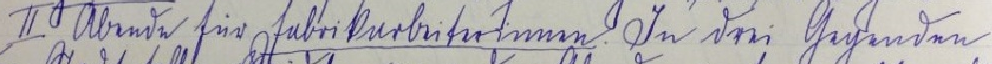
II Abende für Fabrikarbeiterinnen. In den Gegenden
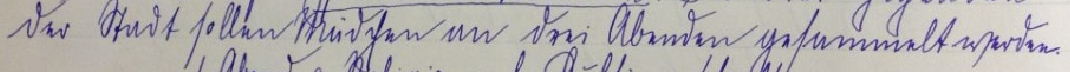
der Stadt sollen Mädchen an drei Abenden gesammelt werden
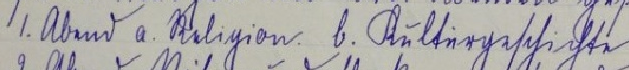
1. Abend a) Religion b) Kulturgeschichte
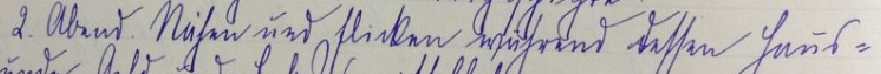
2. Abend Nähen und Flicken während dessen Haus
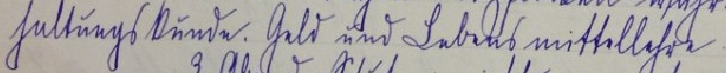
haltungskunde, Geld und Lebensmittelehre
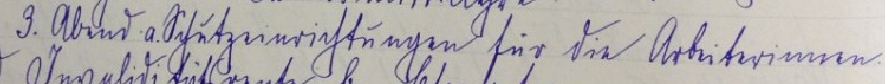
3. Abend a) Schutzeinrichtungen für die Arbeiterinnen
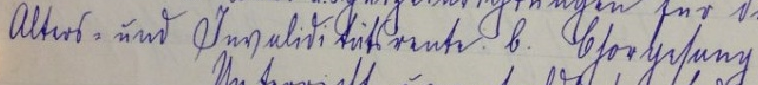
Alters- und Invalidenrente b) Erforschung
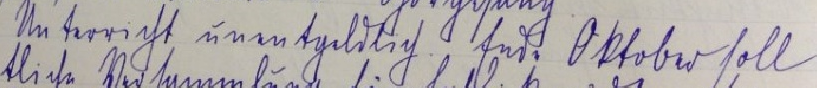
Unterricht unentgeldlich für Oktober soll
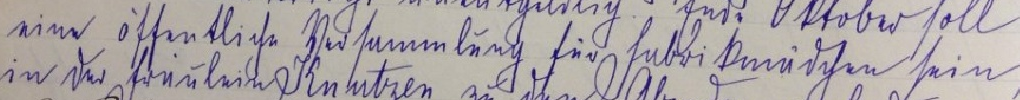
eine öffentliche Versammlung für Fabrikarbeiterinnen sein
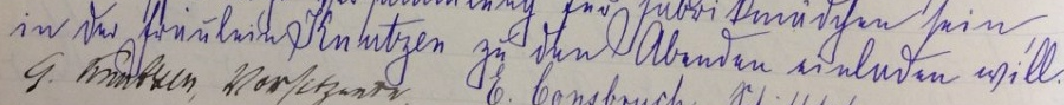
in der Fräulein Knutzen zu den Abenden einladen will
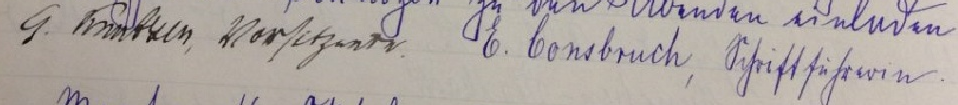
G. Knutzen, Vorsitzende E. Consbruck, Schriftführerin
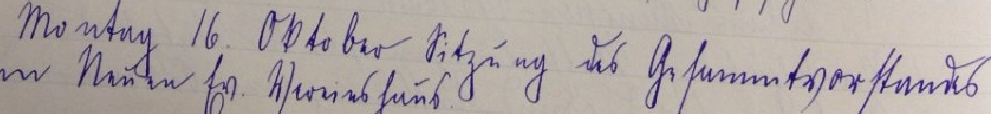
Montag 16. Oktober Sitzung des Gesamtvorstands
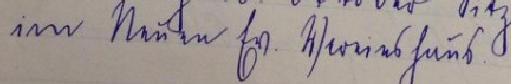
im Neuen Ev. Vereinshaus
